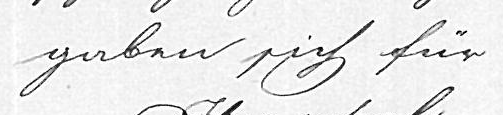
gaben sich für
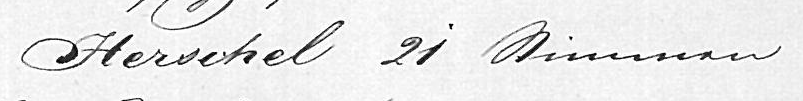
Herschel 21 Stimmen
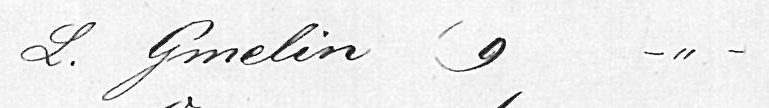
L. Gmelin 9 - "-
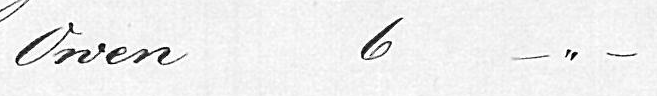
Owen 6 - " -
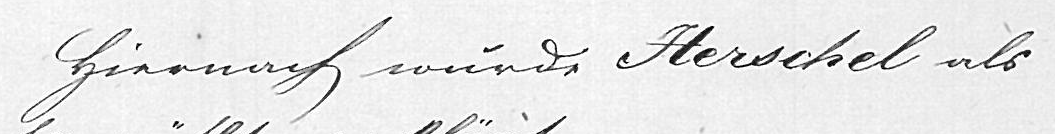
Hiernach wurde Herschel als
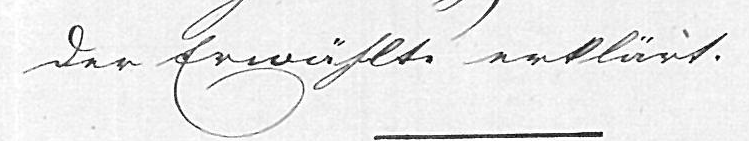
der Erwählte erklärt.
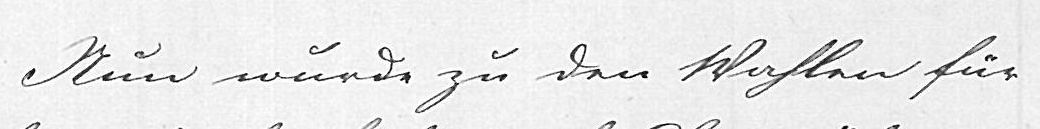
Nun wurde zu den Wahlen für
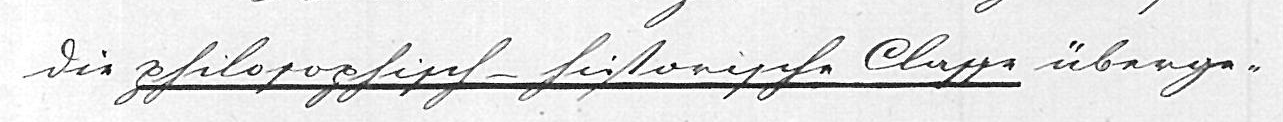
die philosophischen-historische Classe überge-
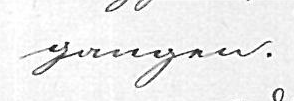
gangen.
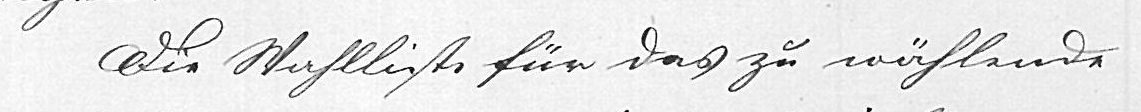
Die Wahlliste für das zu wählende
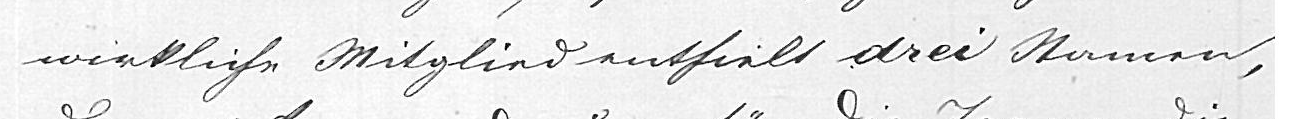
wirkliche Mitglied enthielt drei Namen,
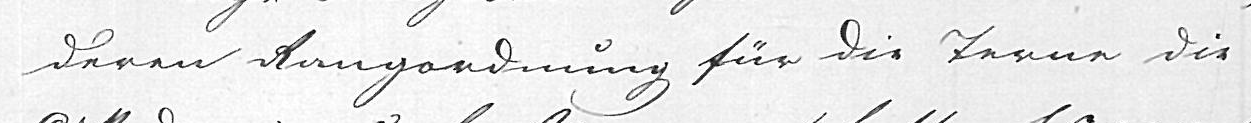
deren Rangordnung für die Terne die
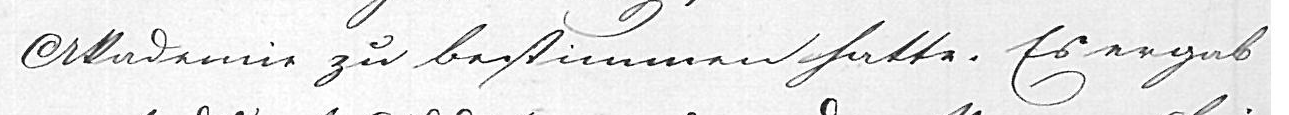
Akademie zu bestimmen hatte. Es ergab
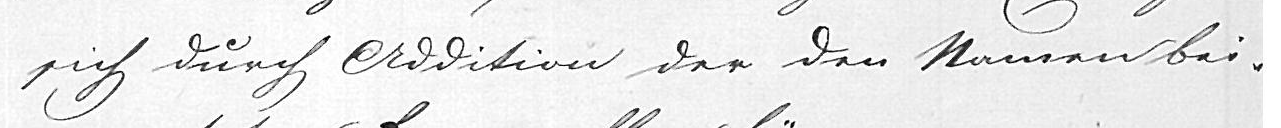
sich durch Addition der den Namen bei-
